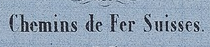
Chemins des Fer Suisses.
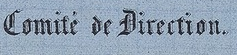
Comité de Direction.
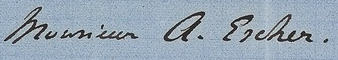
Monsieur A. Escher.
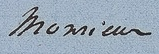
Monsieur
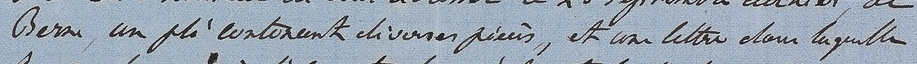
Bern, un pli contenant diverses pièces, et une lettre dans laquelle
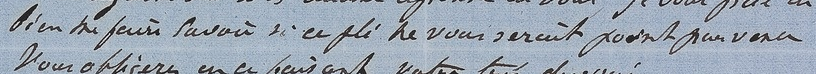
bien me faire savoir si ce pli ne vous serait point parvenu.
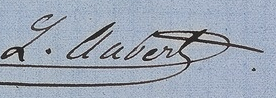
L. Aubert.
